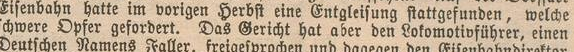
schwere Opfer gefordert. Das Gericht hat aber den Lokomotivführer, einen
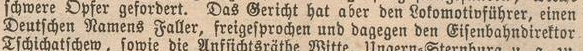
Deutschen Names Faller, freigesprochen und dagegen den Eisenbahndirektor
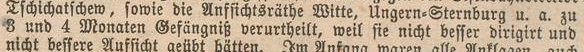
3 und 4 Monaten Gefängniß verurtheilt, weil sie nicht besser dirigirt und
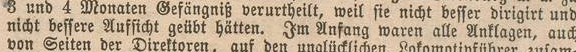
nicht bessere Aufsicht geübt hätten. Im Anfang waren alle Anklagen, auch
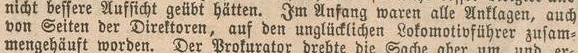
von Seiten der Direktoren, auf den unglücklichen Lokomotivführer zusam-
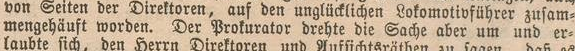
mengehäuft worden. Der Prokurator drehte die Sache aber um und er-
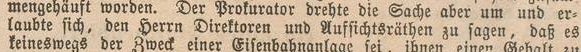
laubte sich, den Herrn Direktoren und Aufsichtsräthen zu sagen, daß es
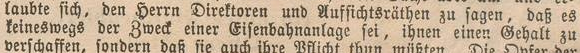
keineswegs der Zweck einer Eisenbahnanlage sei, ihnen einen Gehalt zu
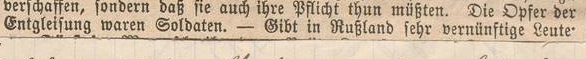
Entgleisung waren Soldaten. – Gibt in Rußland sehr vernünftige Leute
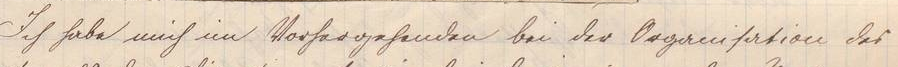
Ich habe mich im Vorhergehenden bei der Organisation des
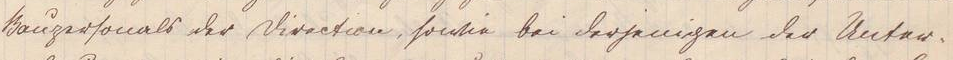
Baupersonals der Direction, sowie bei derjenigen der Unter-
